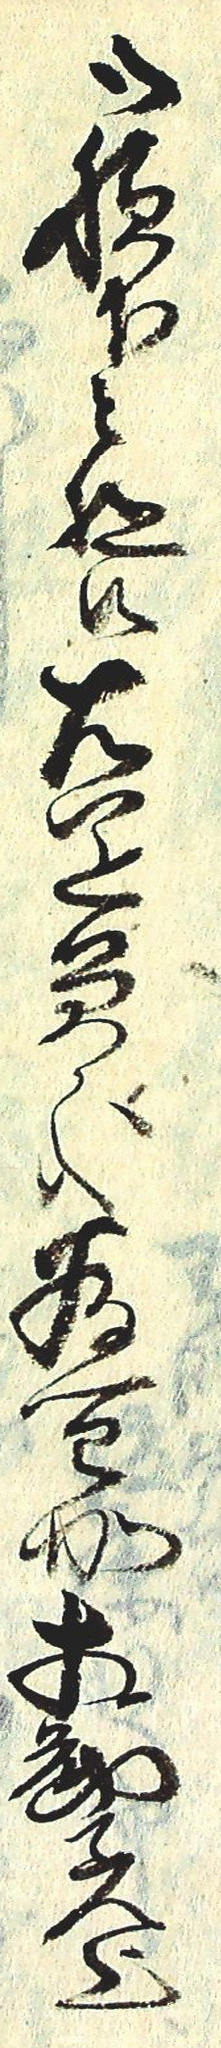御積下被遊候右運賃義為冥加相勤差上
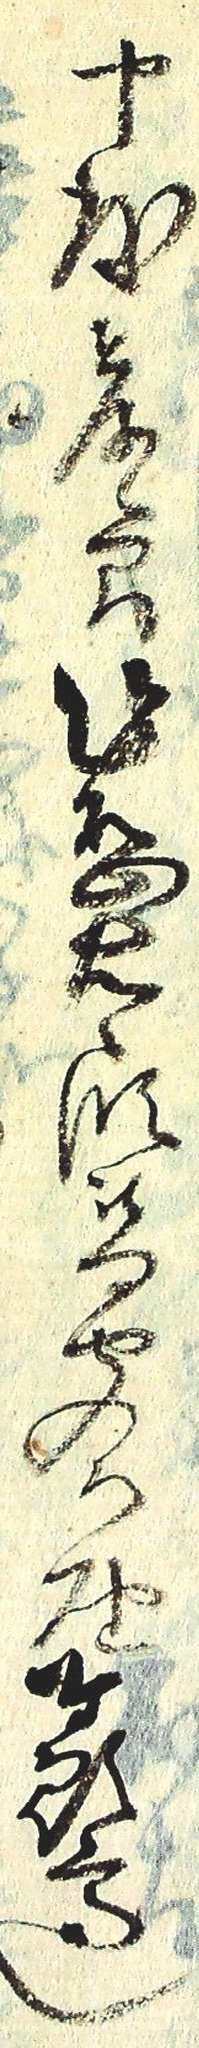申度奉存候間乍恐右之段被為聞召届奉願上通
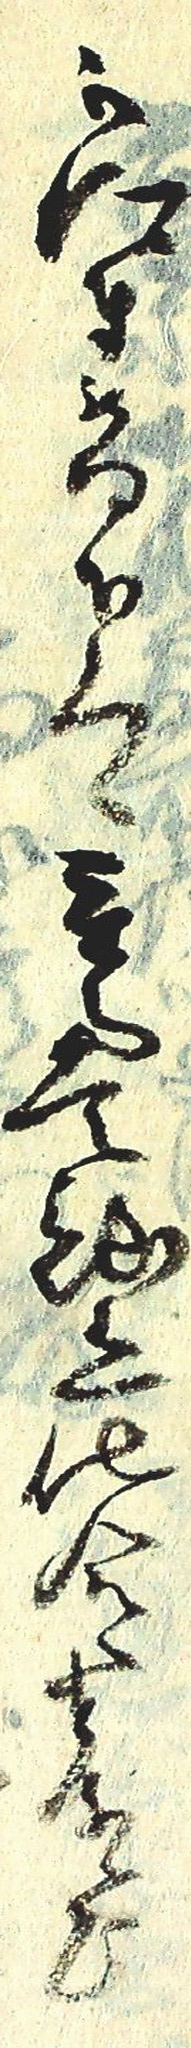被仰付被為下候はゝ重畳難有仕合に奉存候以上
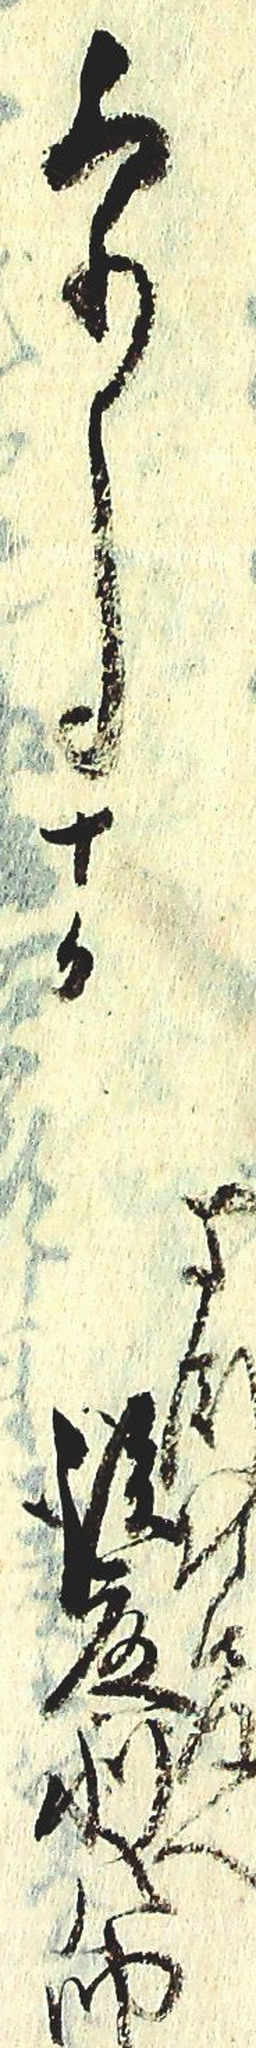卯五月十日後藤利八郎

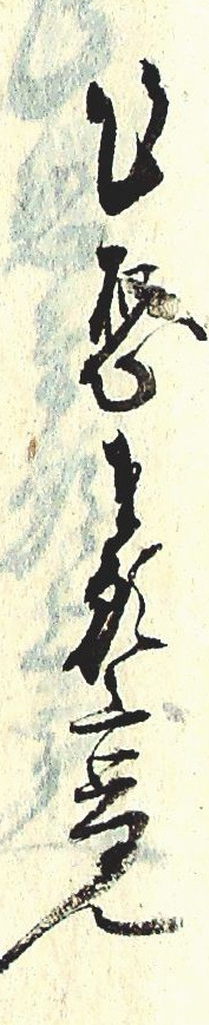乍恐奉願上覚
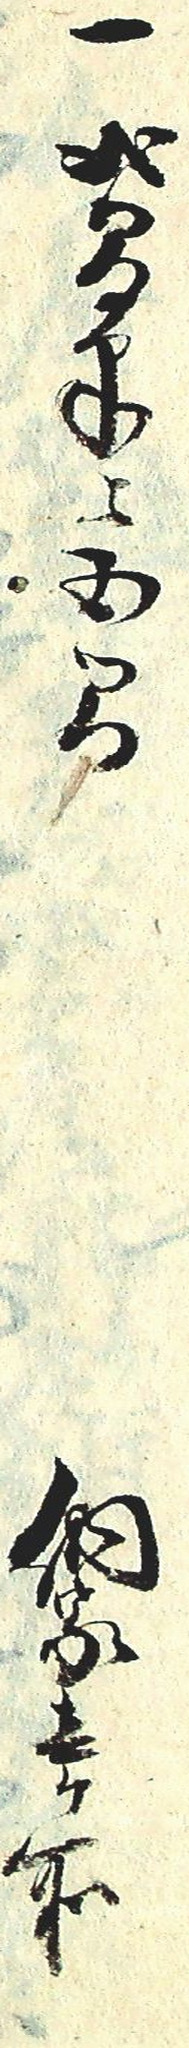一弍間半に五間納家壱ヶ所
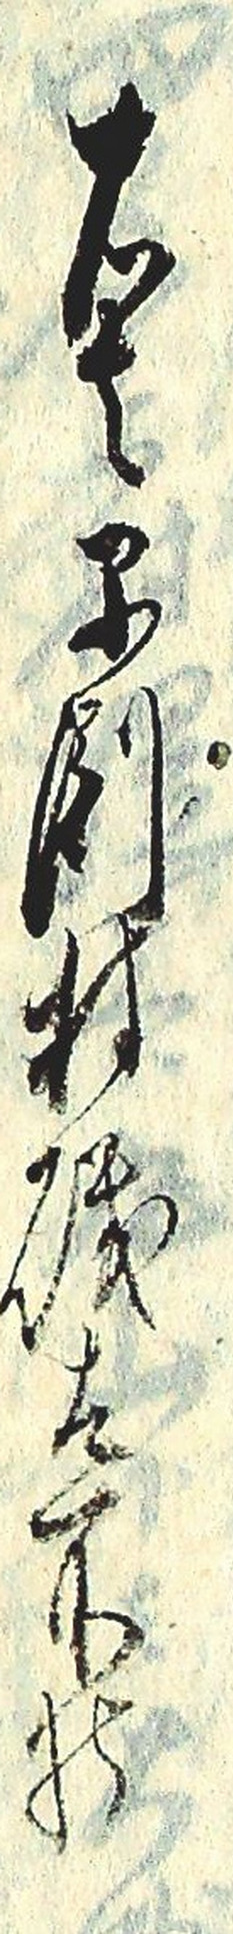右は早淵村磯太所持
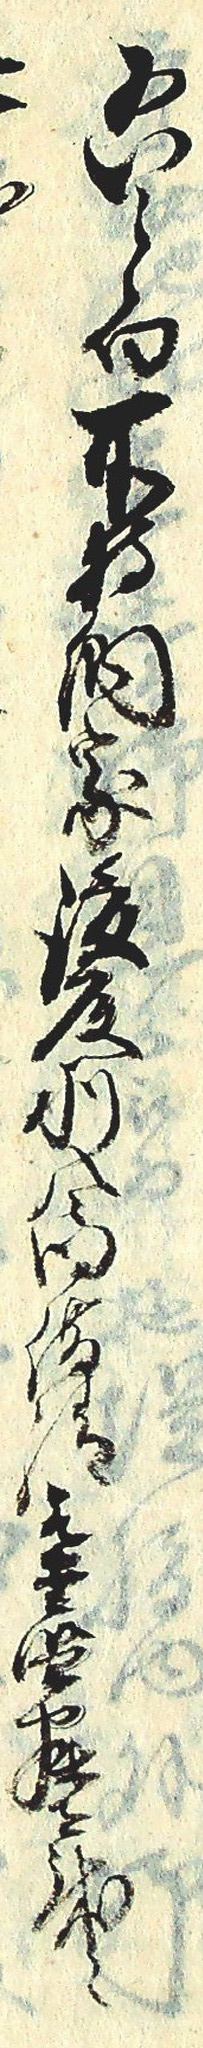右之者所持納家後藤利八郎借請葉藍寐せ床に
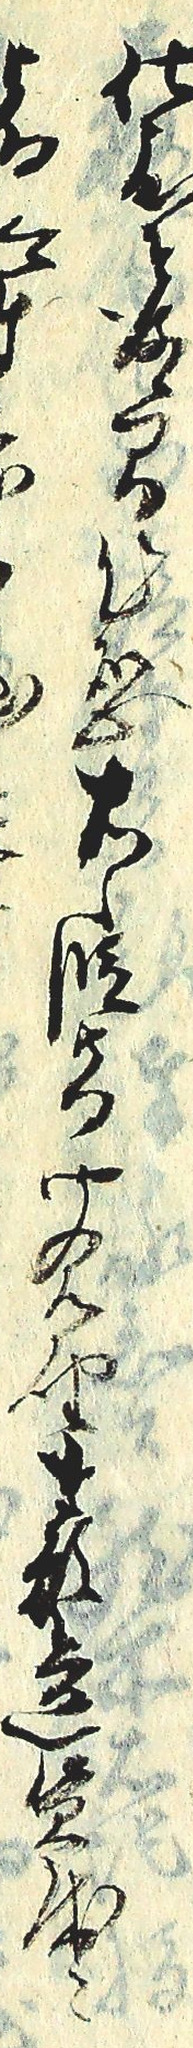仕度奉存候間乍恐右之段被為聞召届奉願上通貸床に
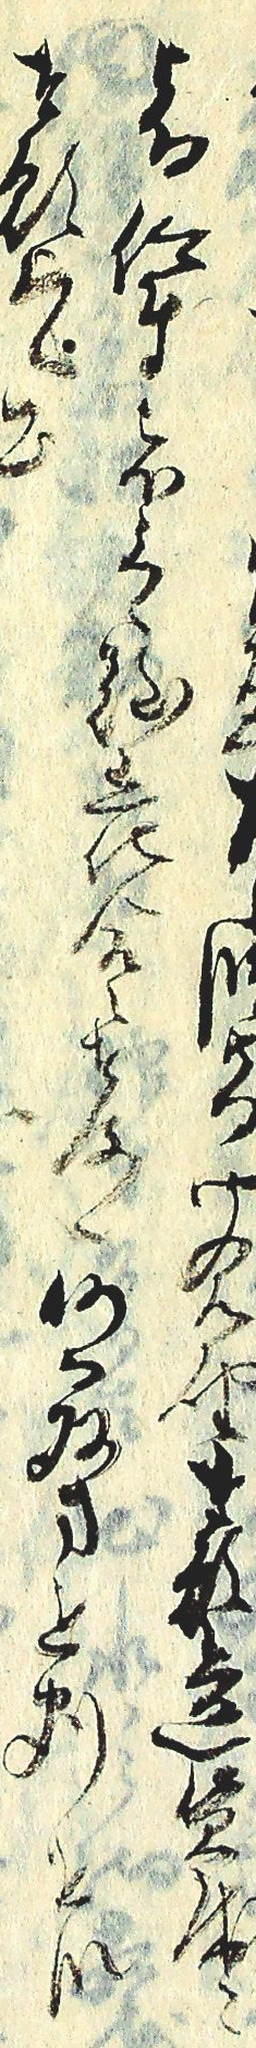被為仰付被下候はゝ難有仕合に奉存候仍て双方連判を以
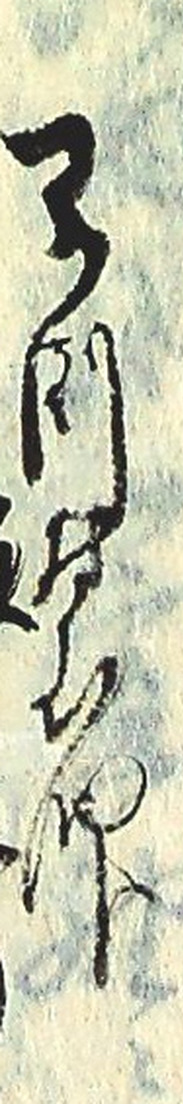早淵村庄屋
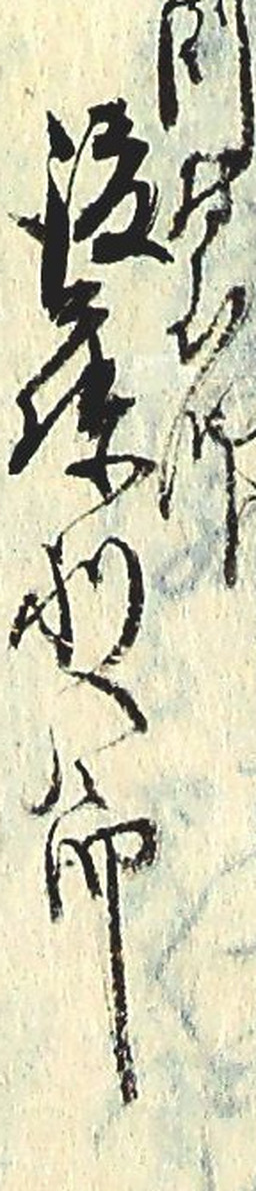後藤利八郎
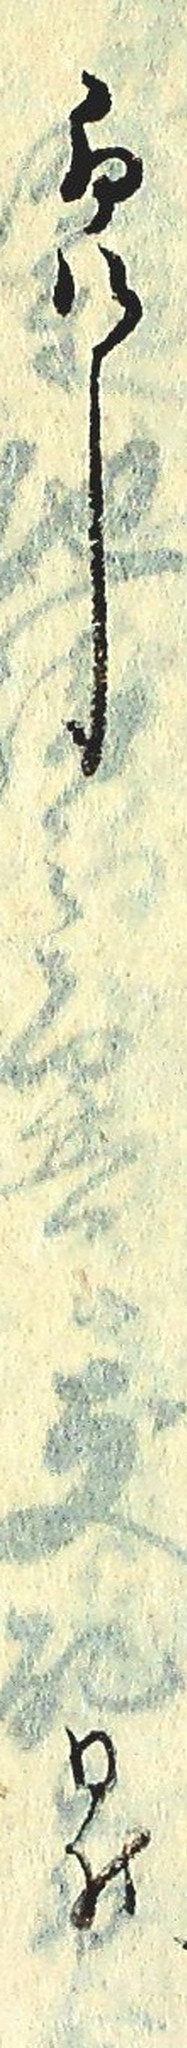卯八月同村
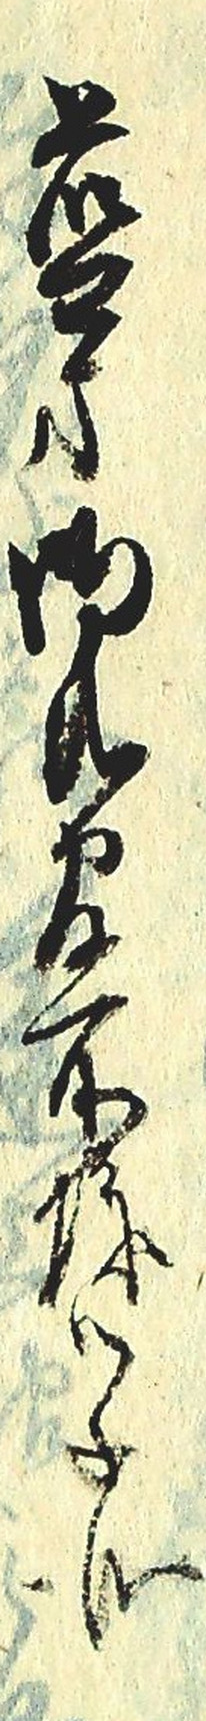藍方御代官所様御手代
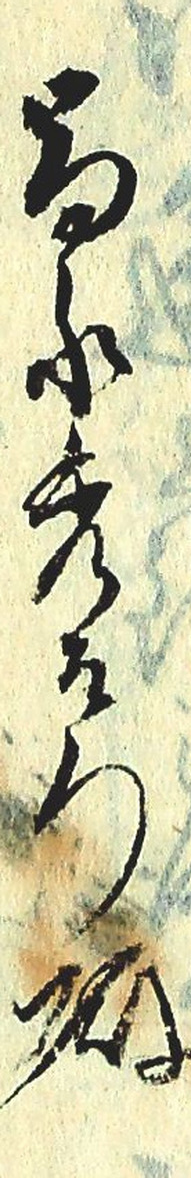富永秀左衛門殿
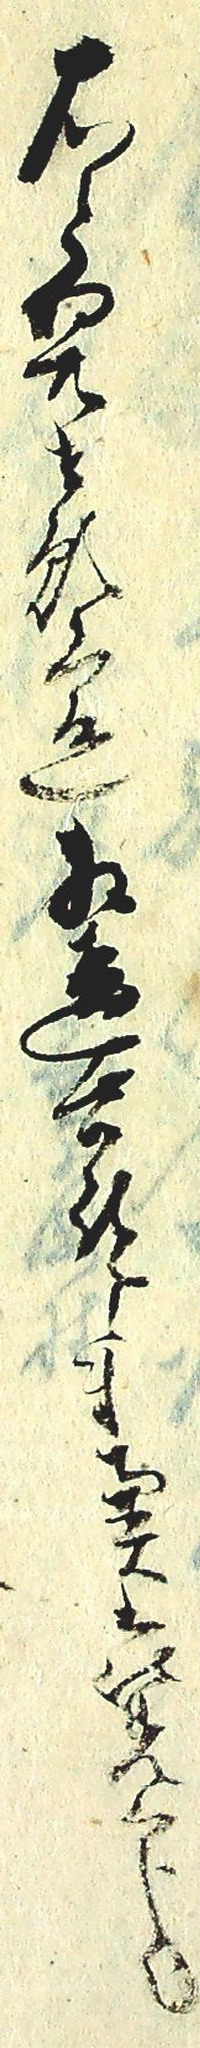右之者共奉願上通相違無御座候に付奥書仕差上申候以上
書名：諸御願書控(弐番）
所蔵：鳴門教育大学 Naruto University of Education
